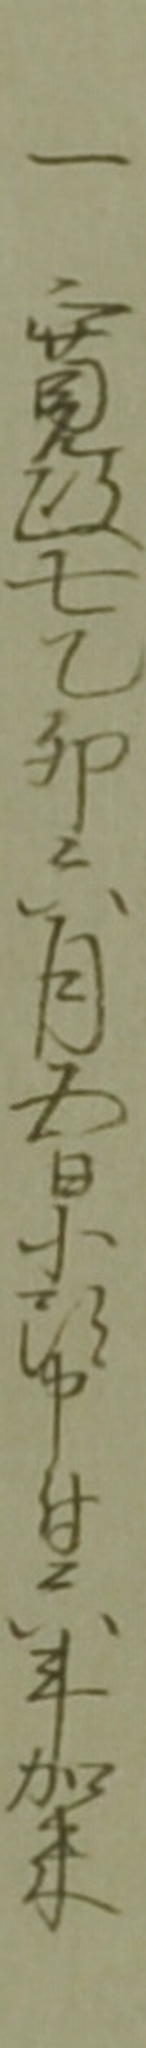一寛政七乙卯六月五日小頭申付六斗加米
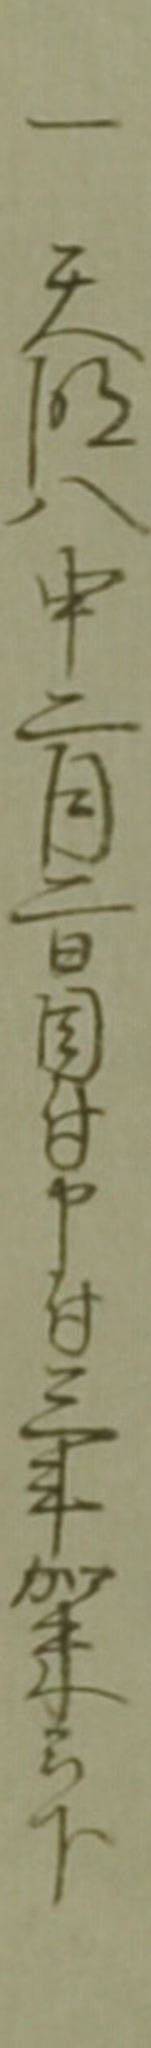一天明八申二月二日目付申付三斗加米被下
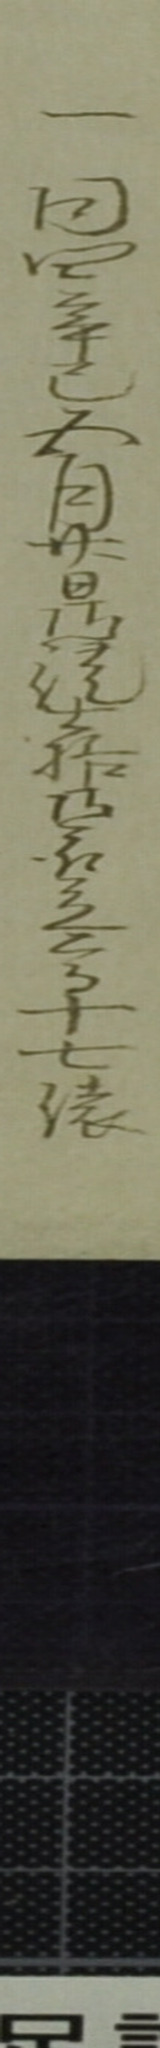一同四辛巳五月廿日御徒士格御取立高十七俵
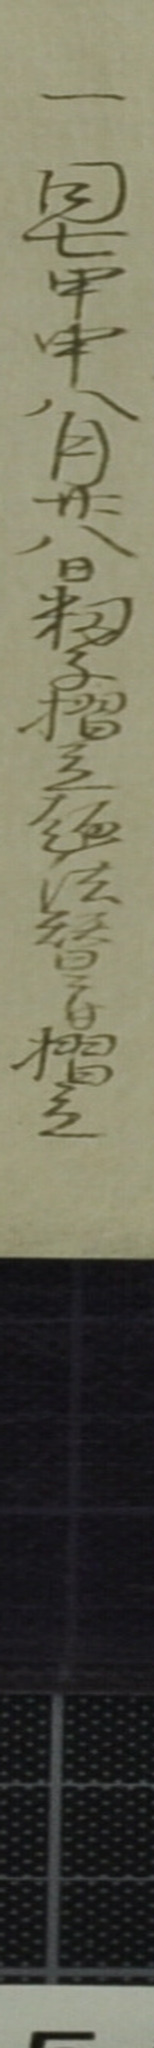一同七甲申八月廿八日籾子摺立趣法替ニ付摺立
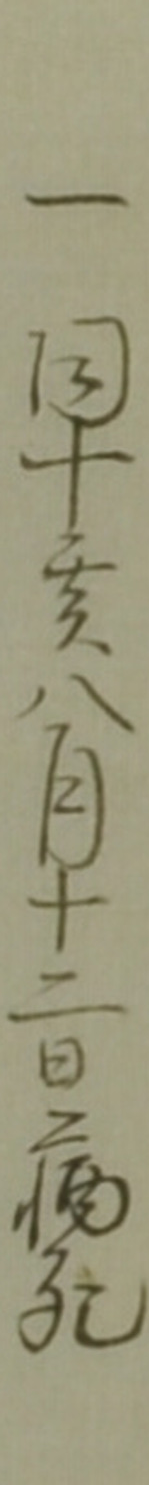一同十亥八月十二日病死
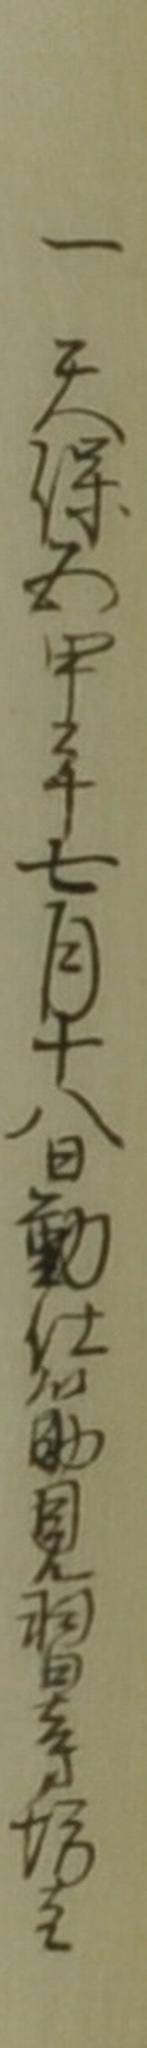一天保五甲午七月十八日勤仕筋見習旁坊主
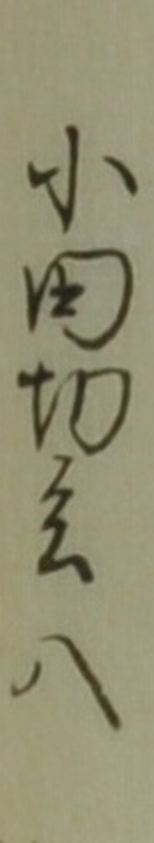小田切兵八
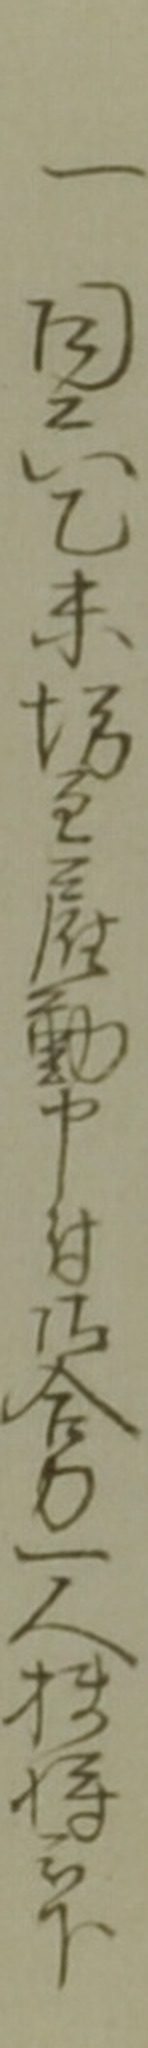一同六乙未坊主雇勤申付御合力一人扶持被下

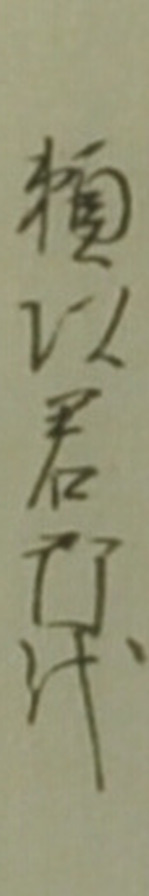頼以君御代
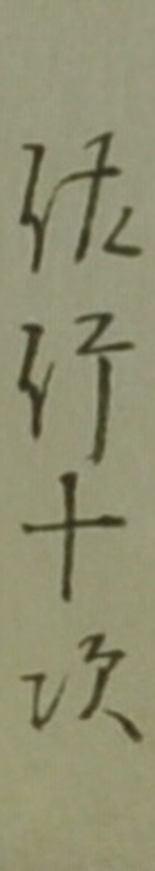佐竹十次

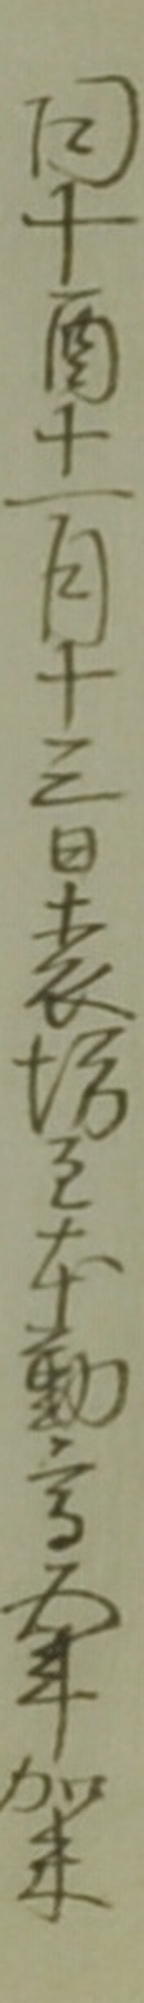一同十酉十一月十三日表坊主本勤高五斗加米
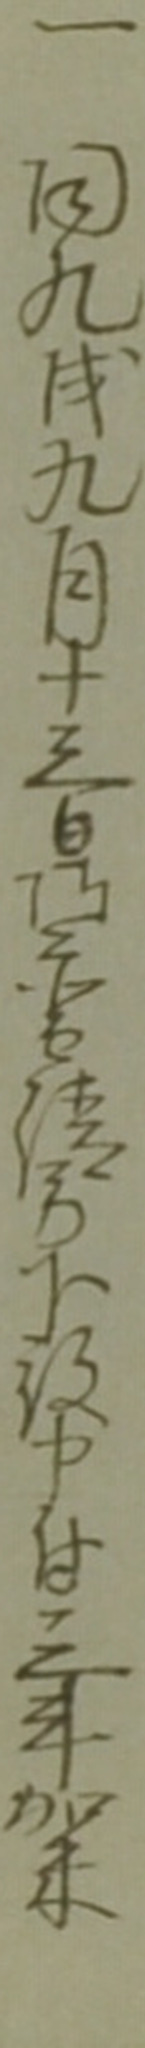一同九戌九月十三日御普請方下役申付三斗加米
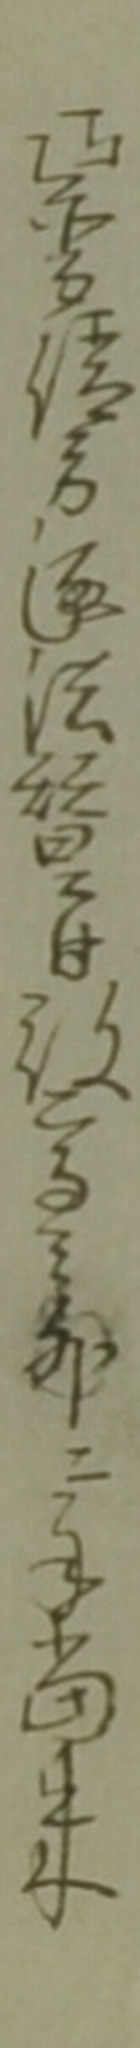御普請方趣法替ニ付役高之外ニ手当米
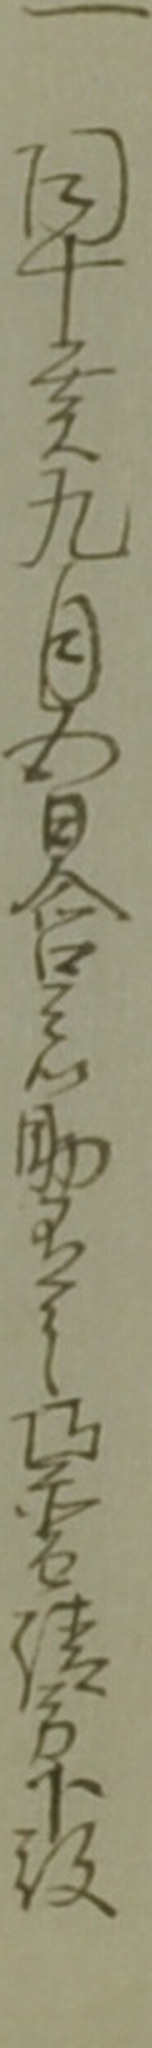一同十亥九月五日含之筋有之御普請方下役
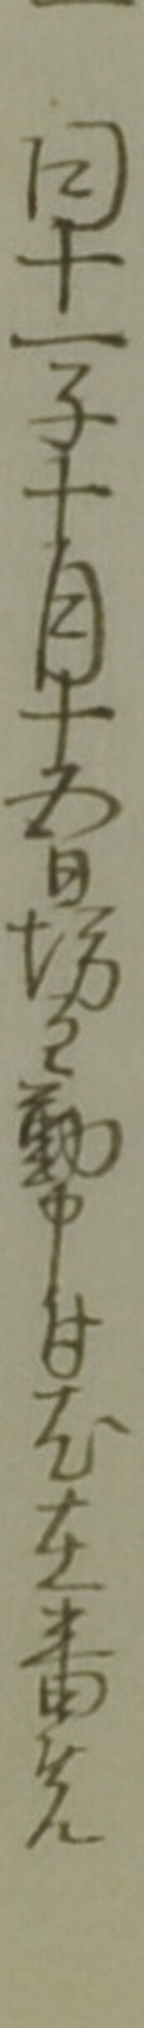一同十一子十月十五日坊主勤申付尤在番先
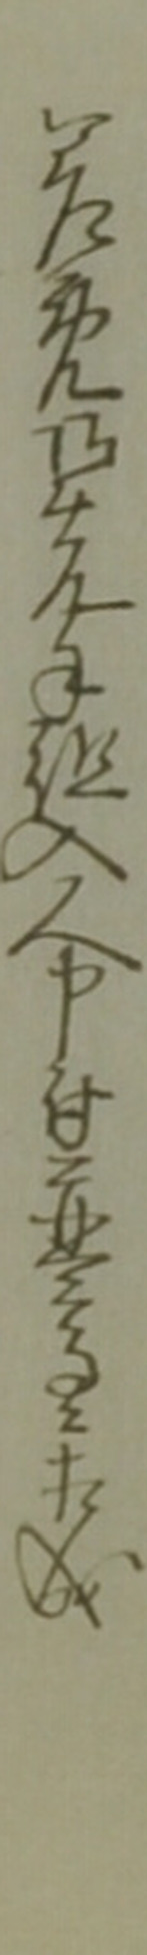差免御先手組入人申付並高ニ相成
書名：無足諸士勤仕録（九）
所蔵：伊那市立高遠町図書館・合同会社AMANE
